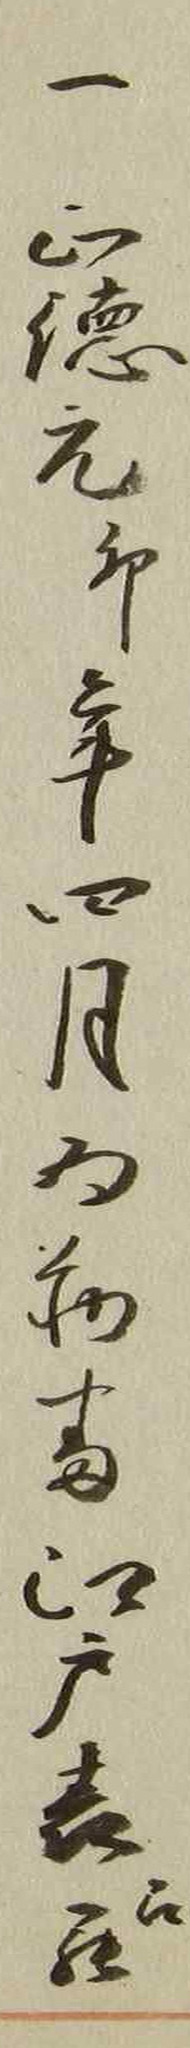一正徳元卯年四月為勤番江戸表江罷
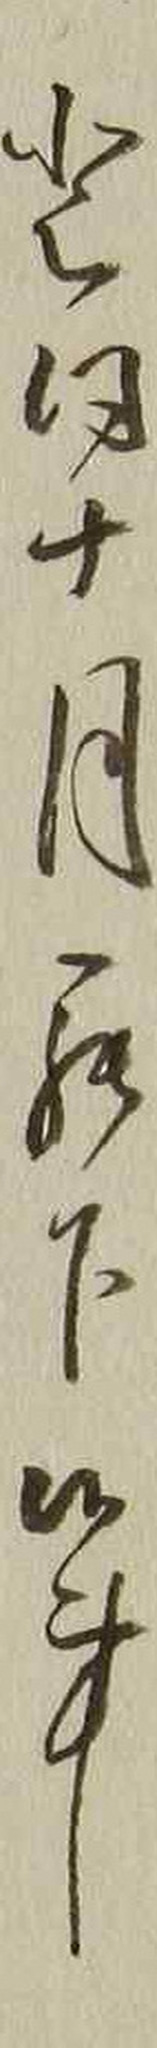登同十月罷下候事
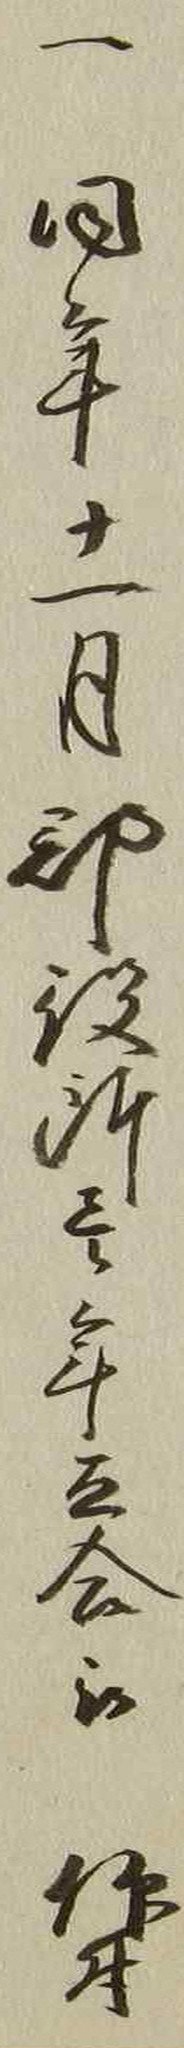一同年十一月郡役所壱年立合被仰付
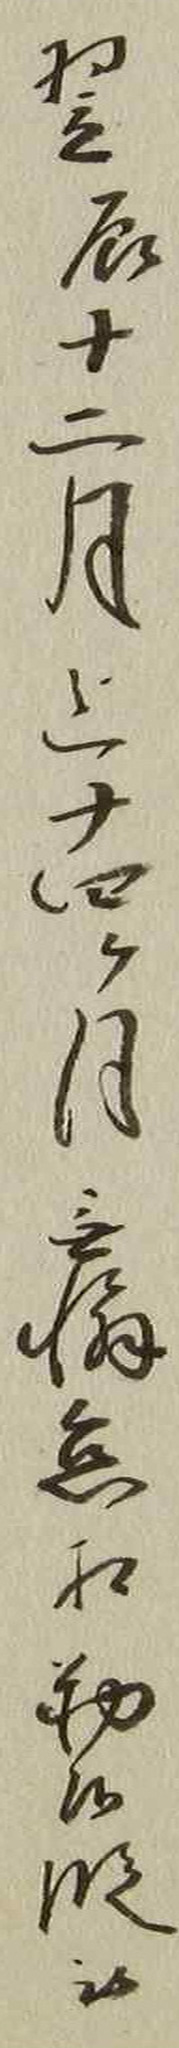翌辰十二月迄十四ヶ月無懈怠相勤候段被
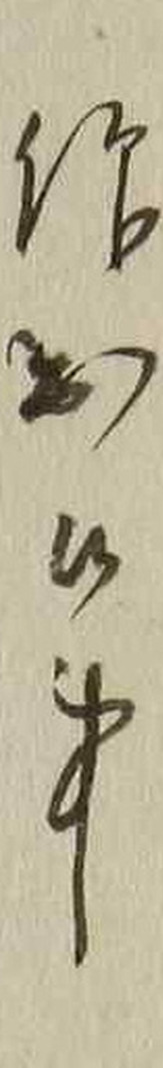仰出候事
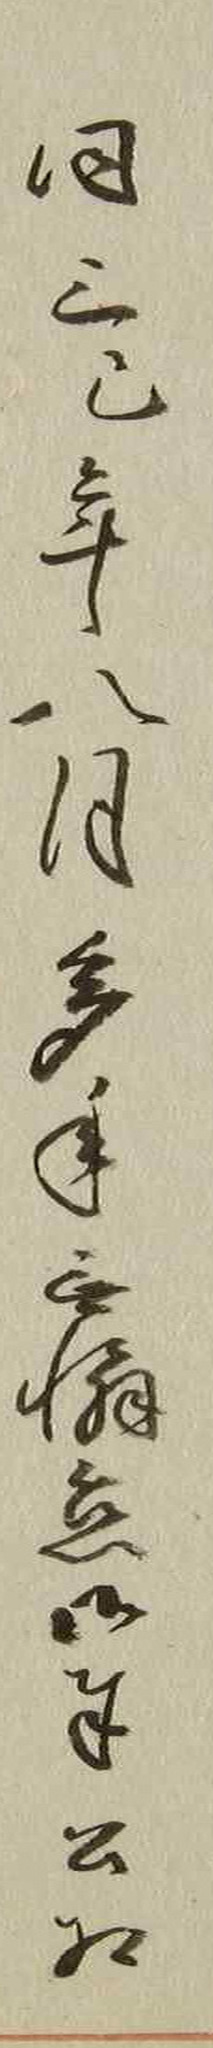一同三巳年八月多年無懈怠御奉公相
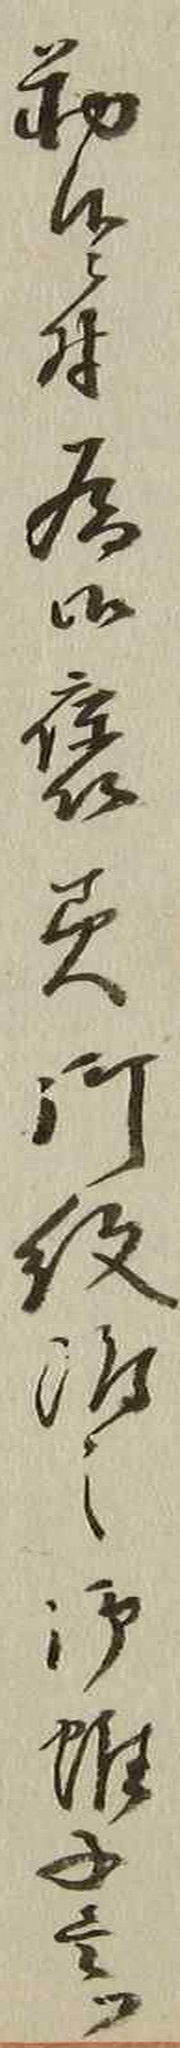勤候ニ付為御褒美御紋附之御帷子壱ツ
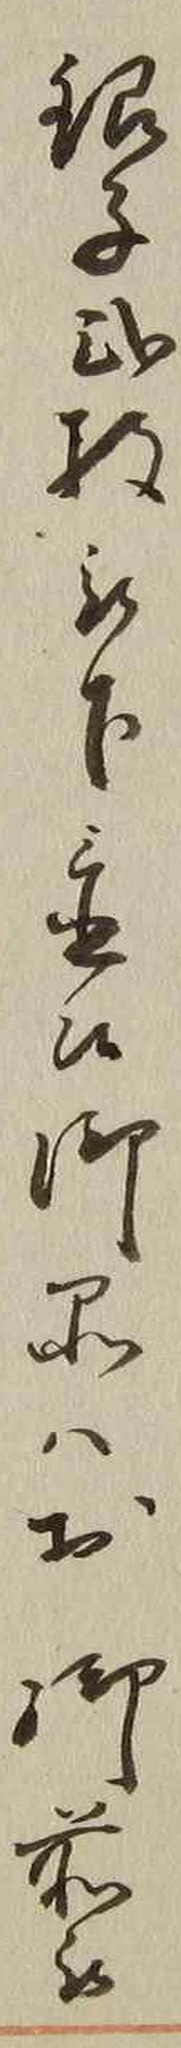銀子弐枚被下置候御品ハ於御前被
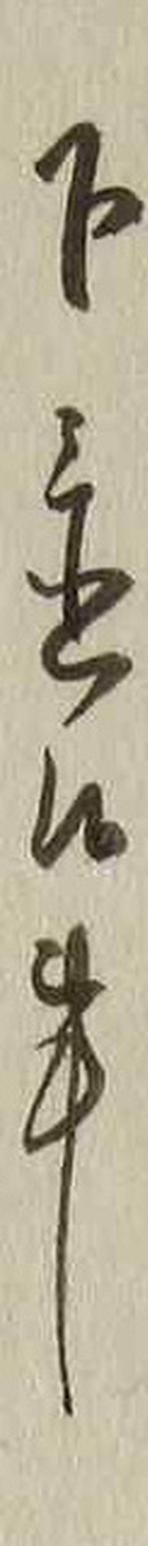下置候事
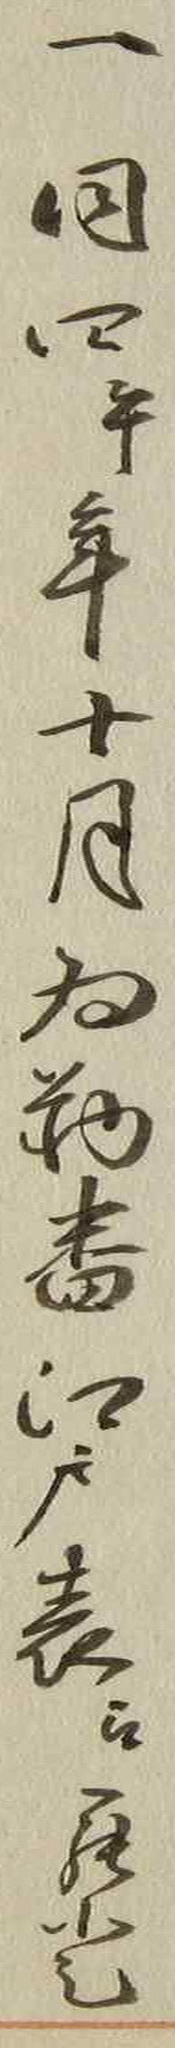一同四午年十月為勤番江戸表江罷登
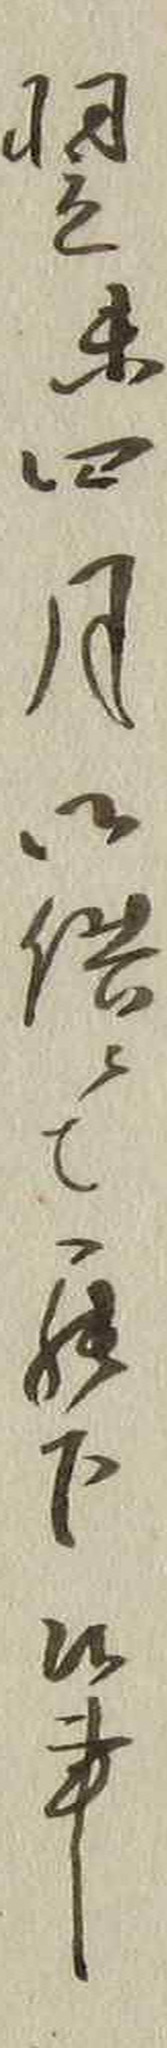翌未四月御供ニて罷下候事
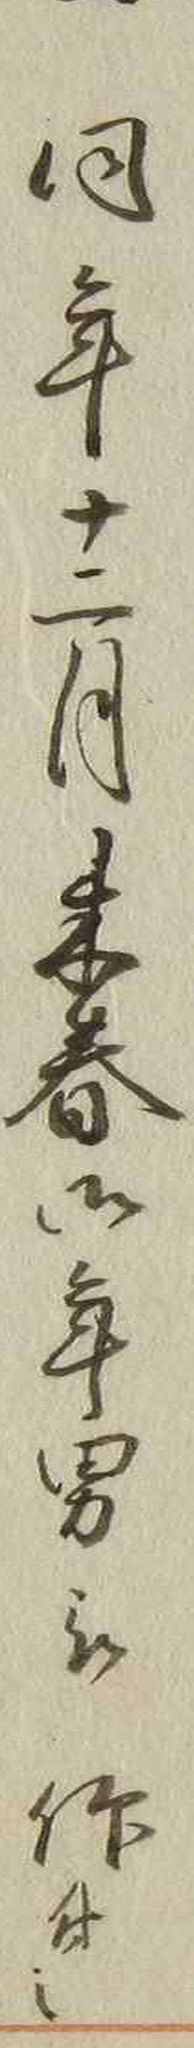一同年十二月来春御年男被仰付之
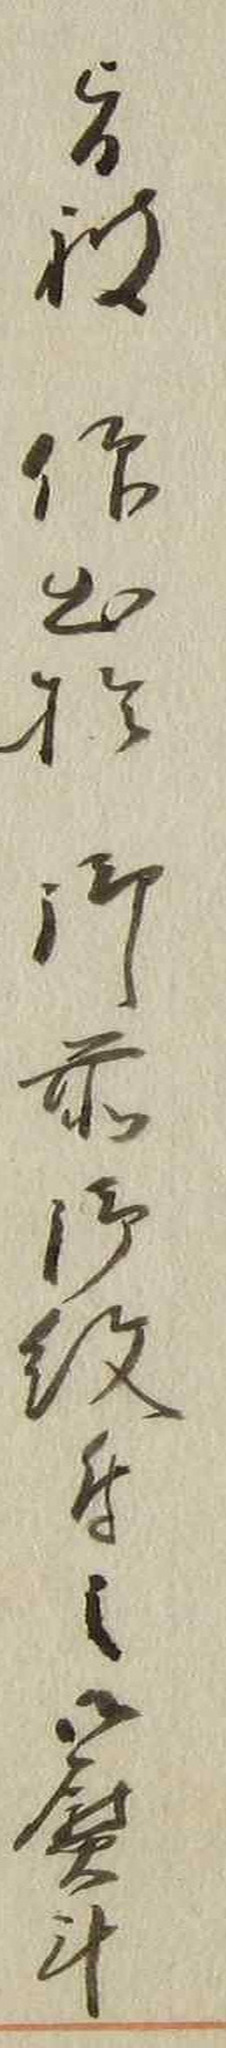旨被仰出於御前御紋付之御熨斗
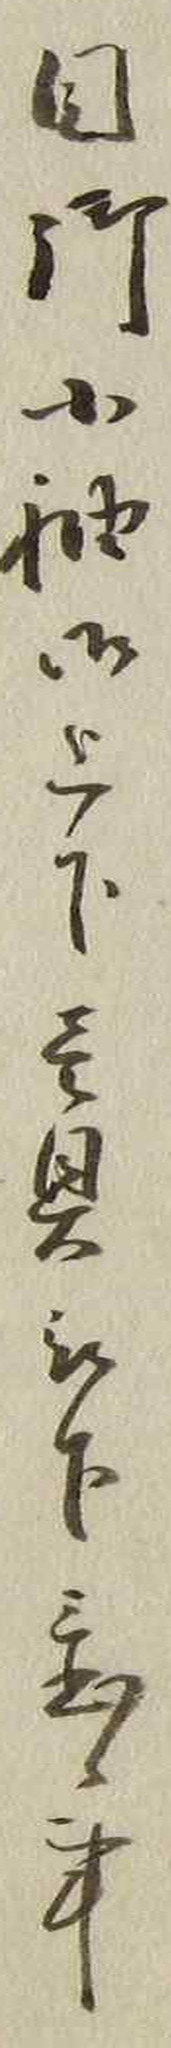目御小袖御上下壱具被下置候事
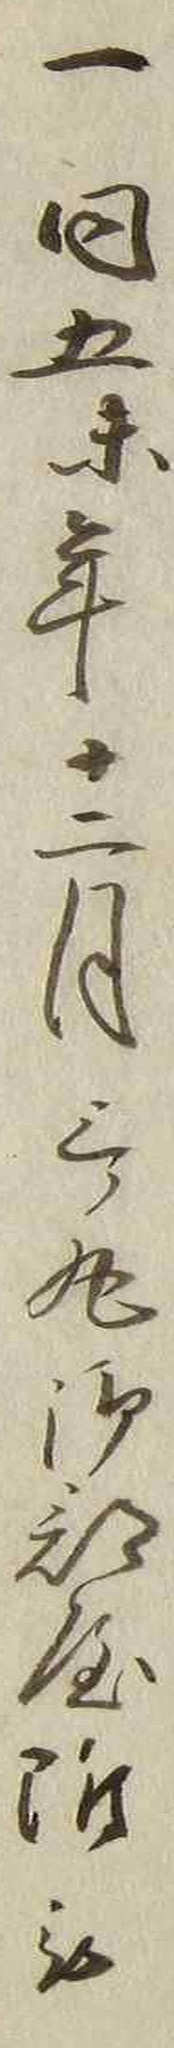一同五未年十二月三ノ丸御部屋附被
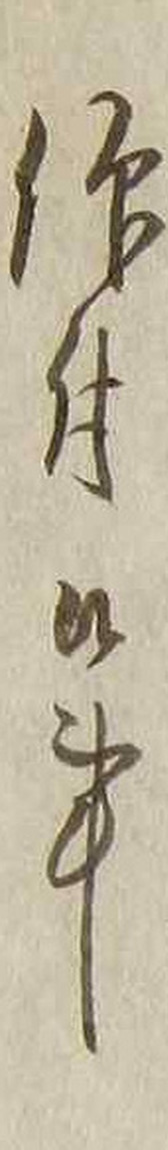仰付候事
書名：諸士系譜　巻之122　よ之部5
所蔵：会津若松市立会津図書館
